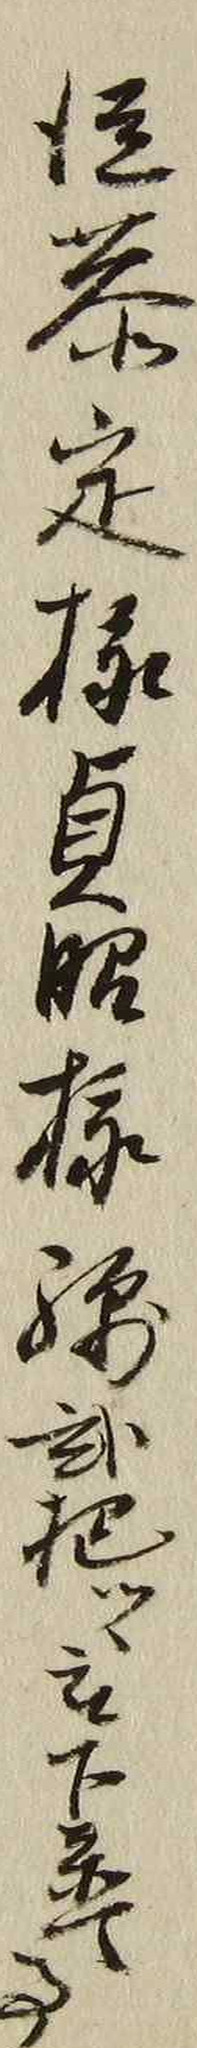従恭定様貞昭様綿弐把ツヽ被下置候事
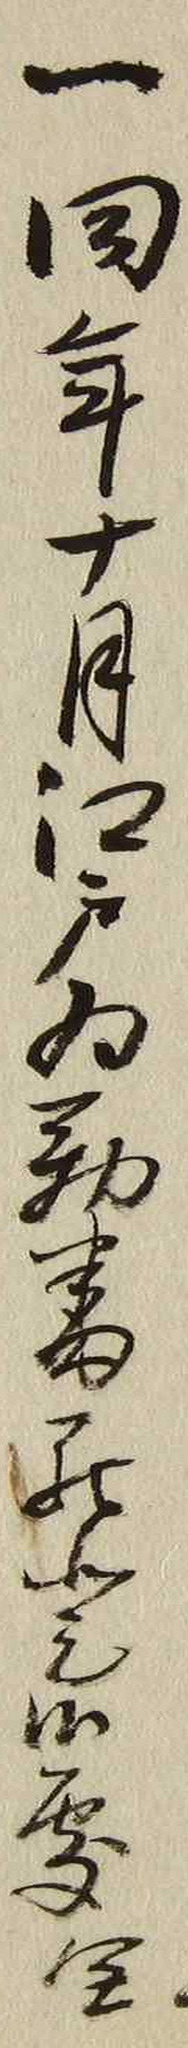一同年十月江戸為勤番罷登候処閏
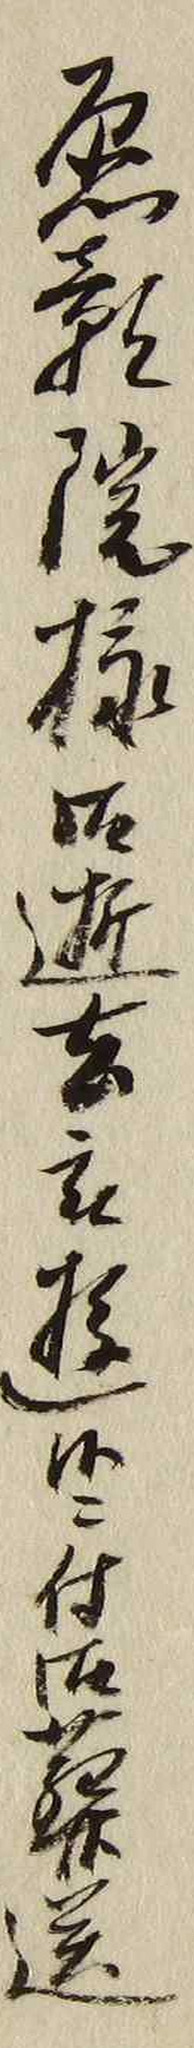愿彰院様御逝去被遊候ニ付御葬送
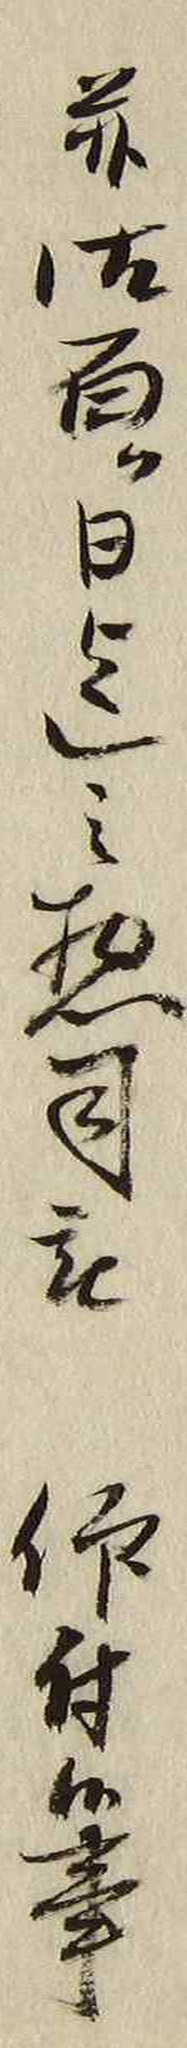并御百ケ日迄之惣司被仰付候事
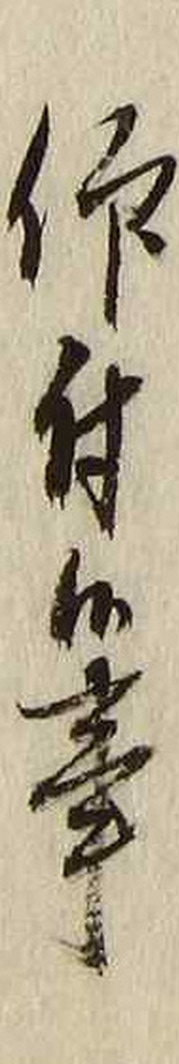仰付候事
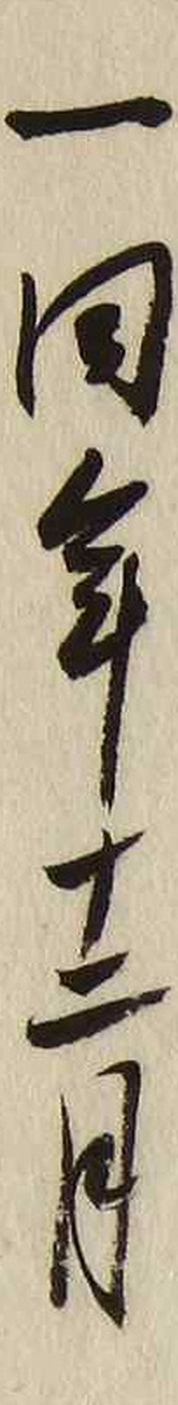一同年十二月

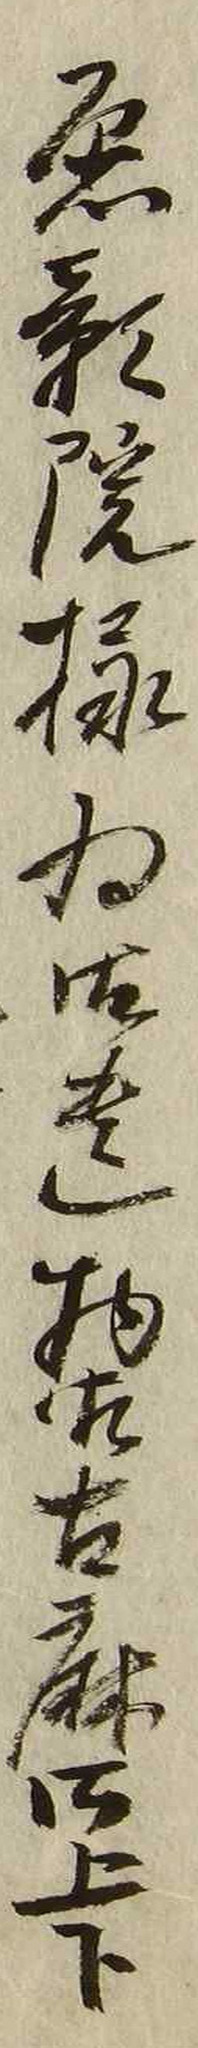愿彰院様為御遺物御古麻御上下
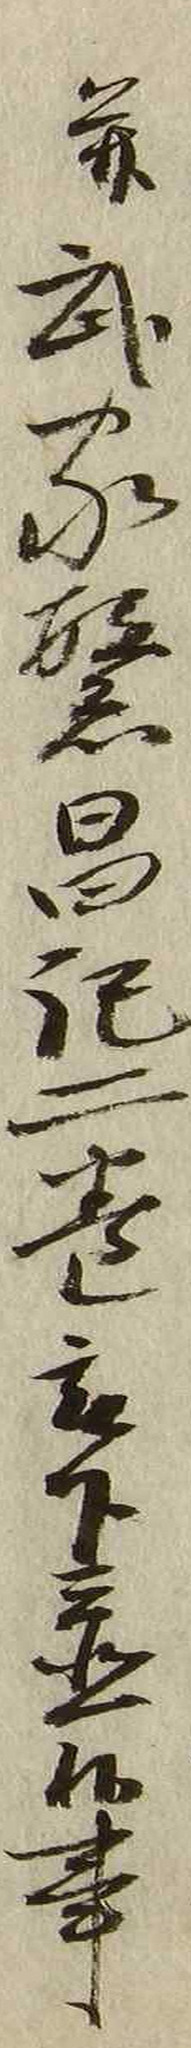并武家繁昌記二巻被下置候事
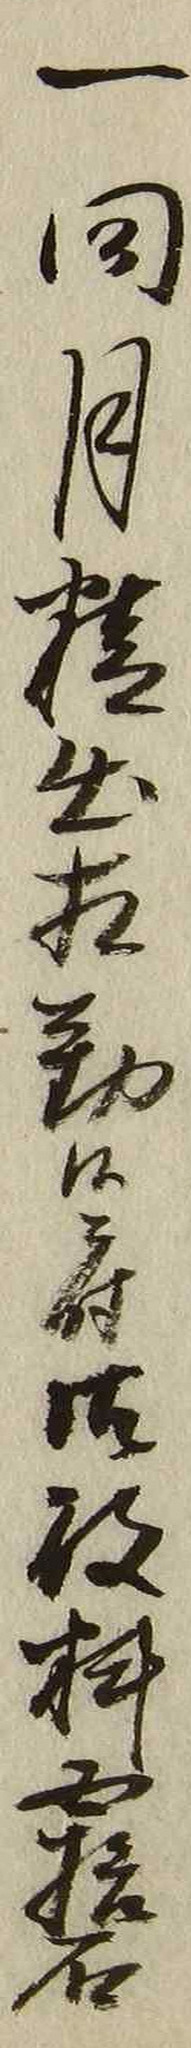一同月精出相勤候ニ付御役料五拾石
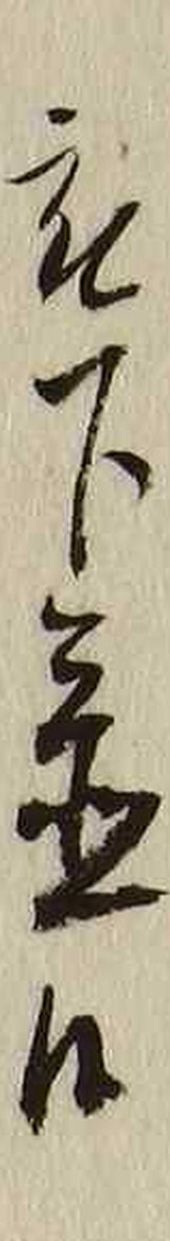被下置候
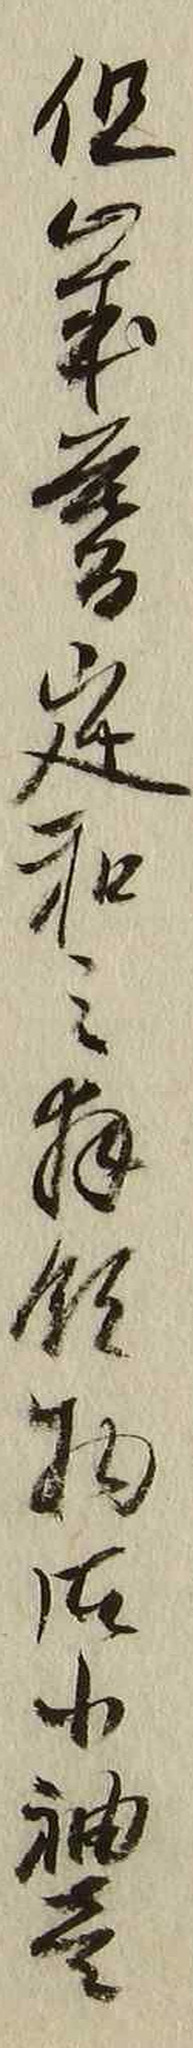但歳暮定和之拝領物御小袖壱
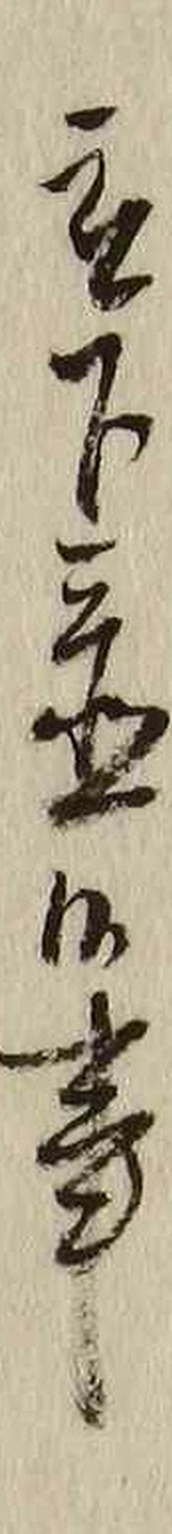被下置候事
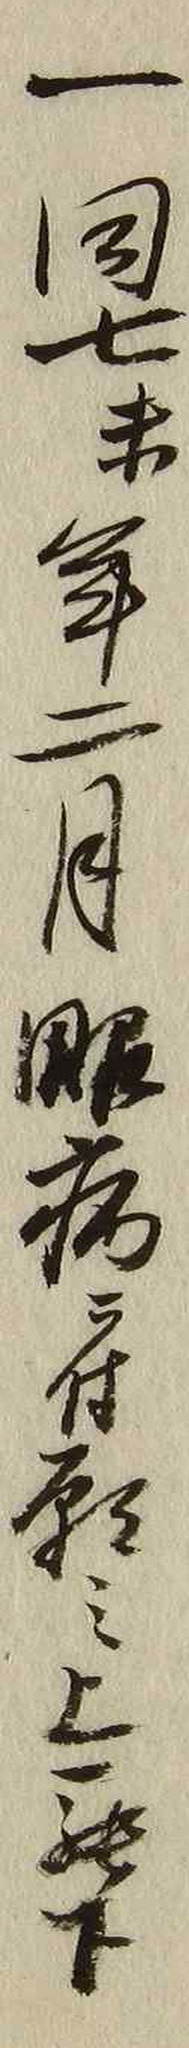一同七未年二月眼病ニ付願之上罷下
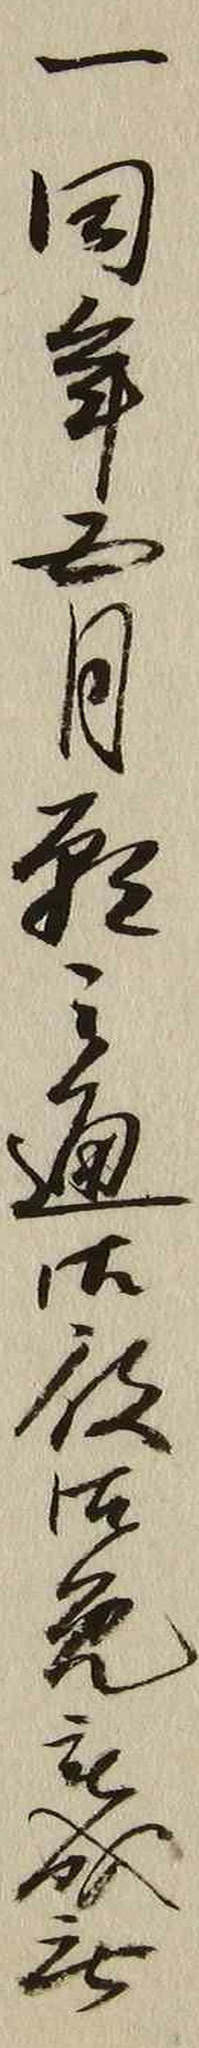一同年五月願之通御役御免被成無
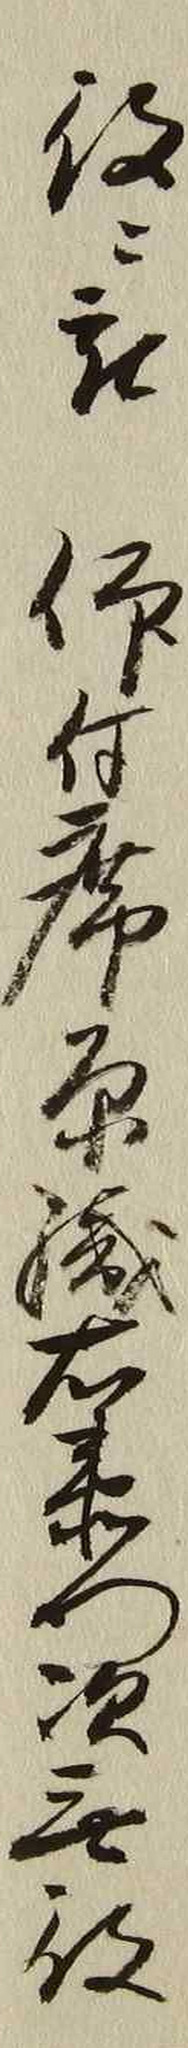役ニ被仰付席原織右衛門次無役
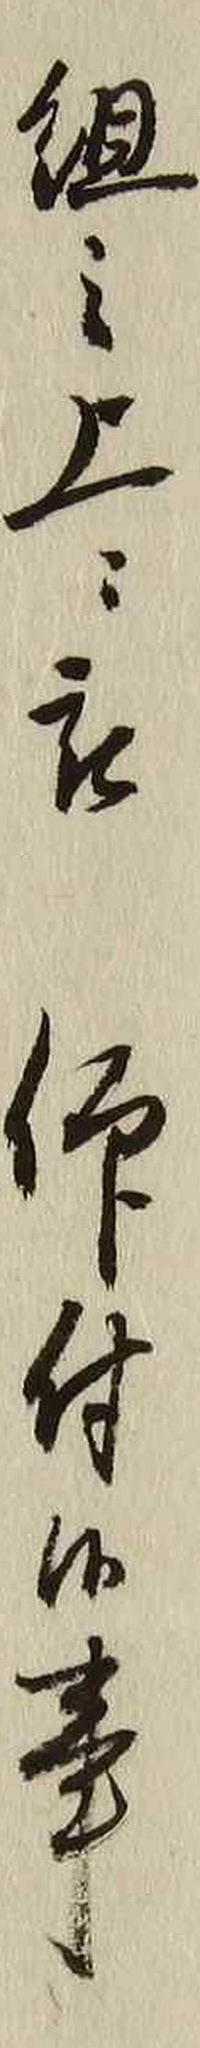組之上ニ被仰付候事
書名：諸士系譜　巻之356　す之部6
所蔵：会津若松市立会津図書館
